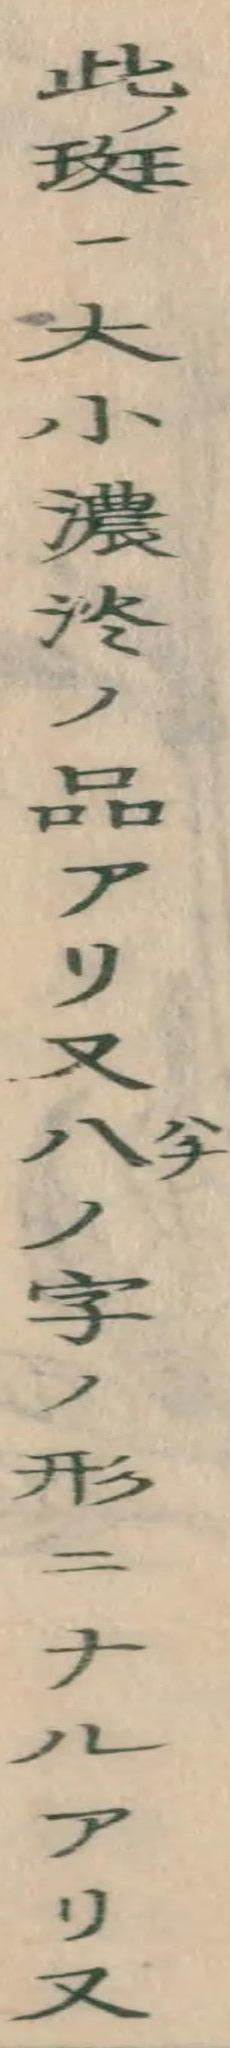此斑一大小濃淡ノ品アリ又八ノ字ノ形ニナルアリ又
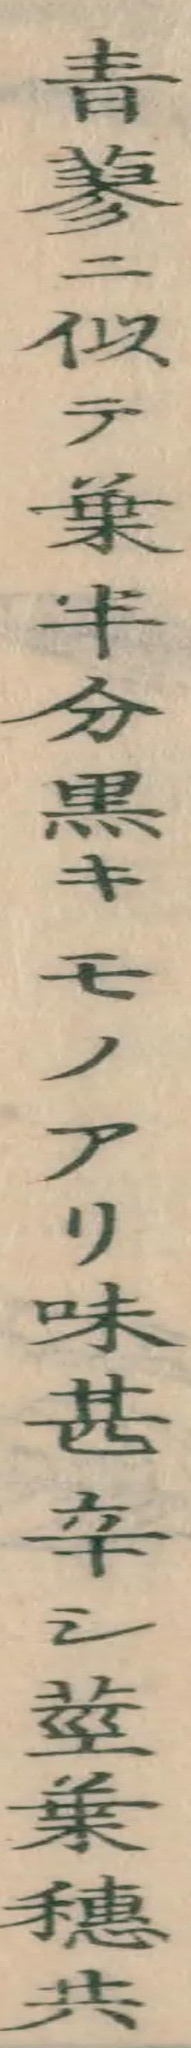青蓼ニ似テ葉半分黒キモノアリ味甚辛シ茎葉穂共
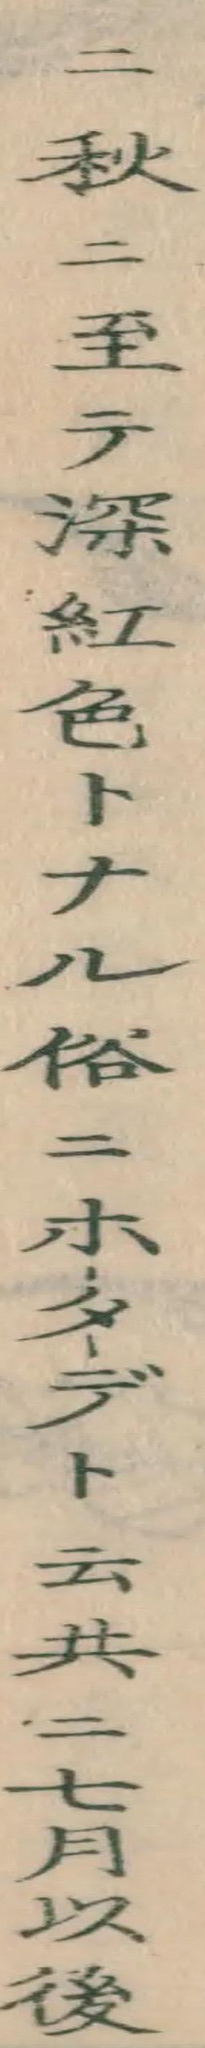ニ秋ニ至テ深紅色トナル俗ニホ-タ-デト云共ニ七月以後
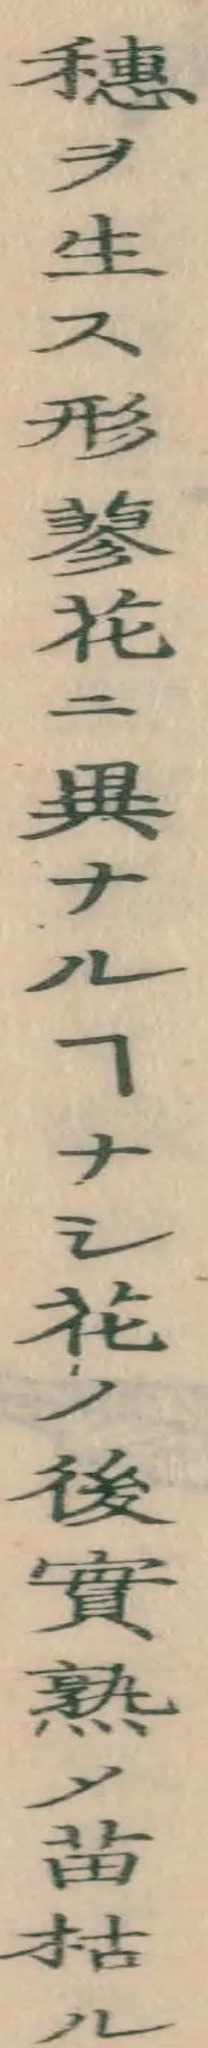穂ヲ生ス形蓼花ニ異ナルコトナシ花ノ後実熟シテ苗枯ル
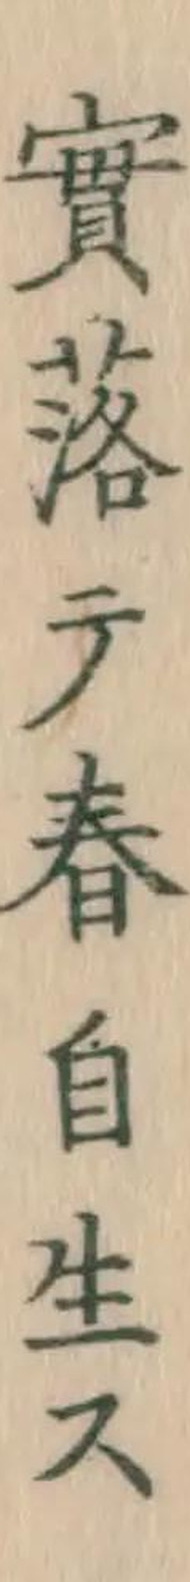実落テ春自生ス
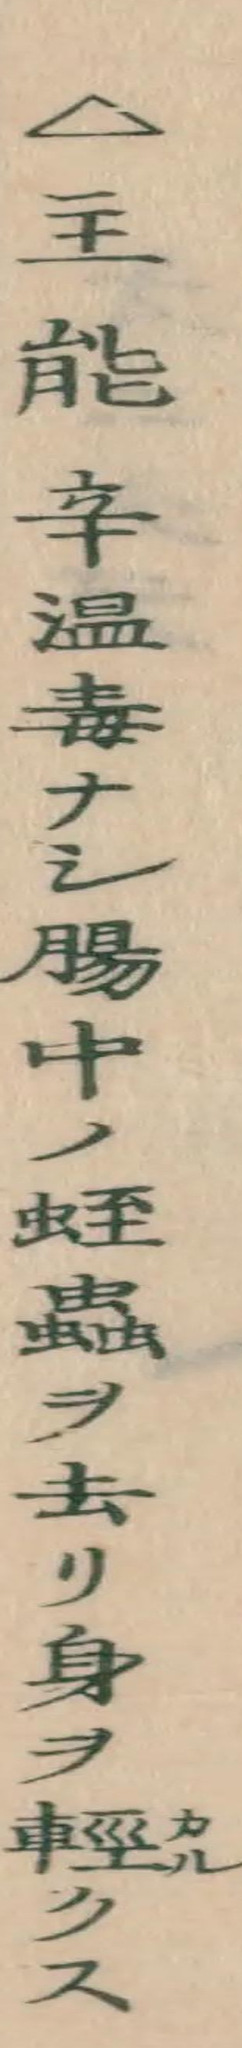△主能辛温毒ナシ腸中ノ蛭虫ヲ去リ身ヲ軽クス
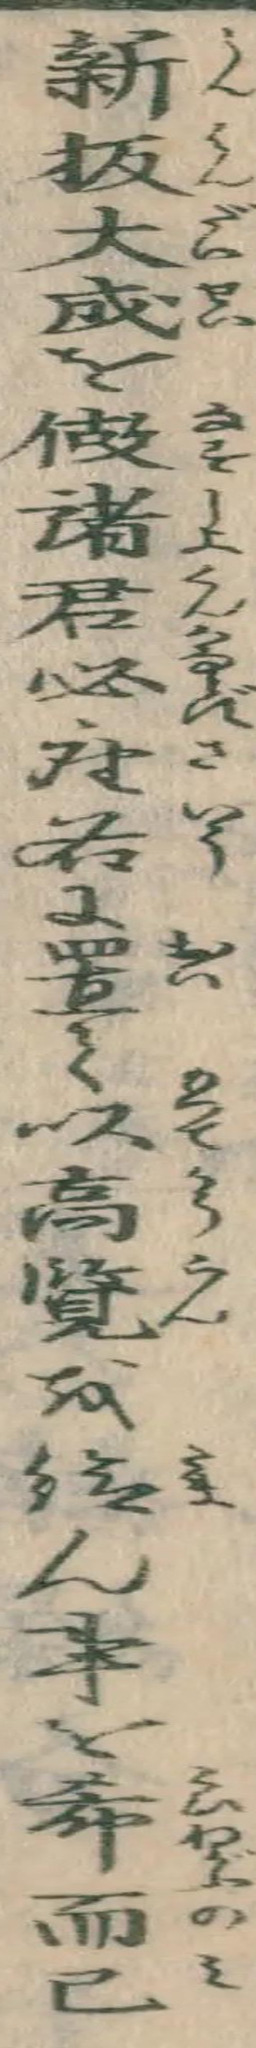新板大成を做諸君必座右に置て以高覧を給ん事を希而已
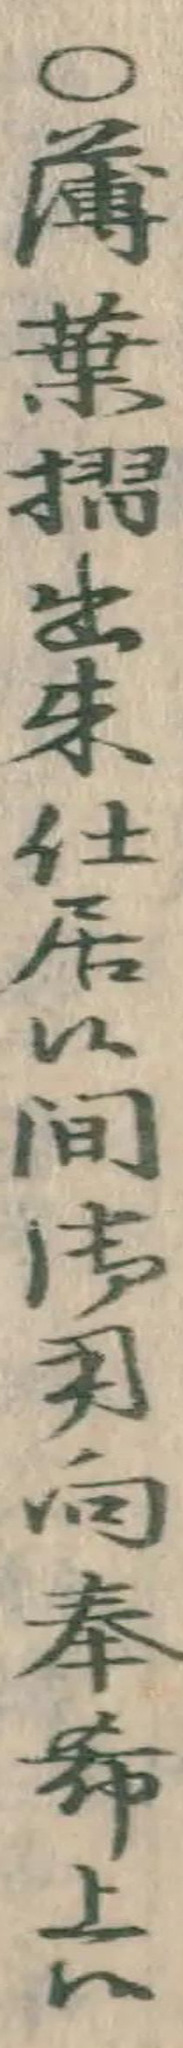○薄葉摺出来仕居候間御用向奉希上候
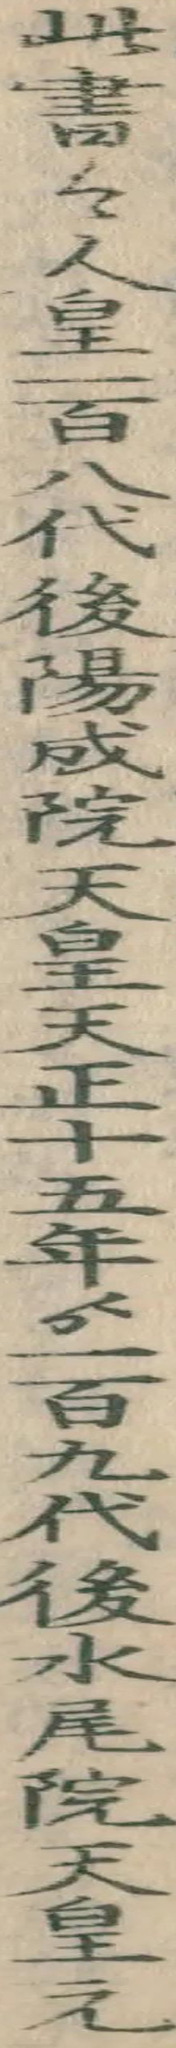此書は人皇一百八代後陽成院天皇天正十五年ゟ一百九代後水尾院天皇元
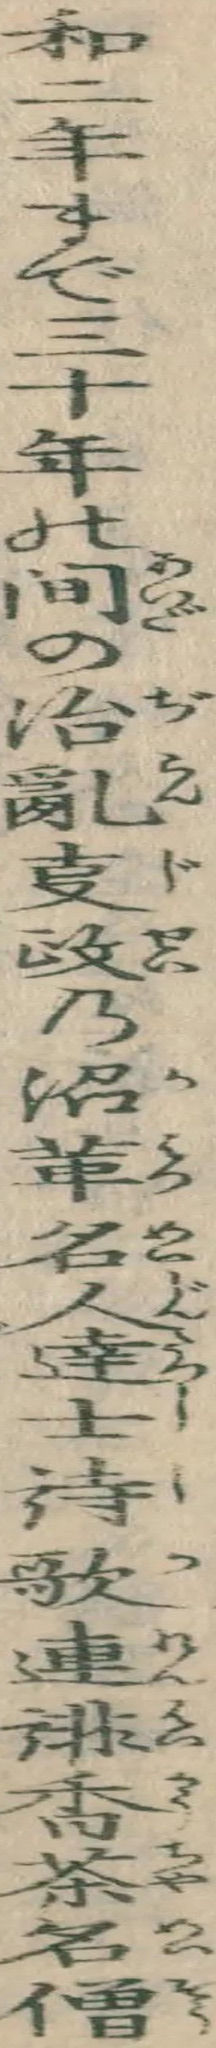和二年まで三十年の間の治乱事政の沿革名人達士詩歌連誹香茶名僧
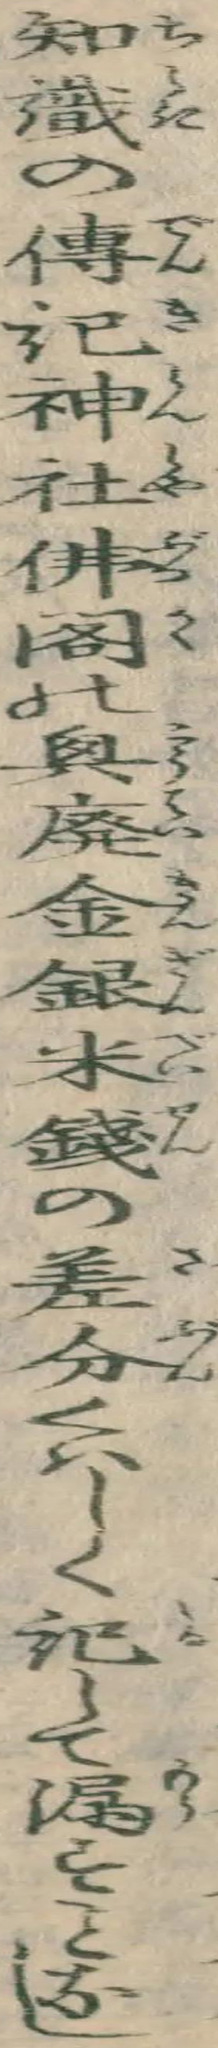知識の伝記神社仏閣の興廃金銀米銭の差分くはしく記して漏すことなし
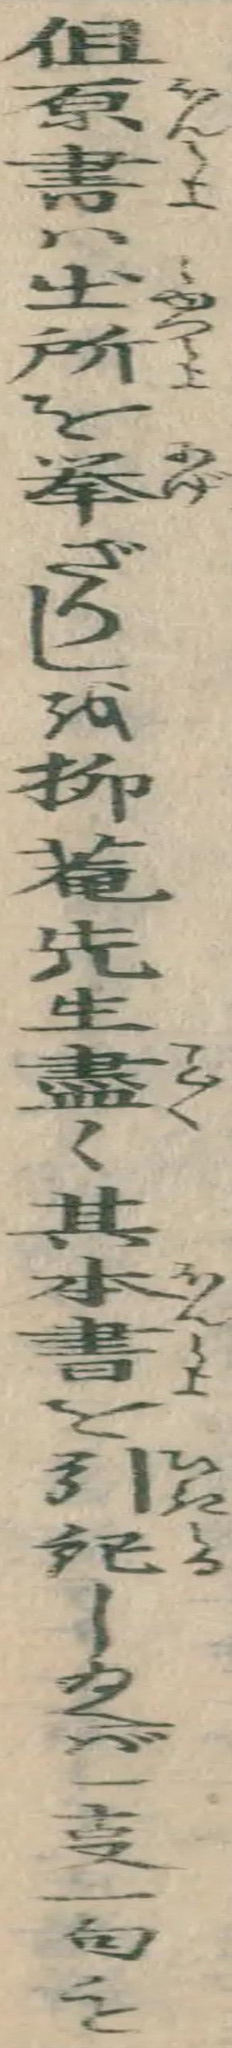但原書は出所を挙ざりしを柳菴先生尽く其本書を引記し給也ば一事一句迄
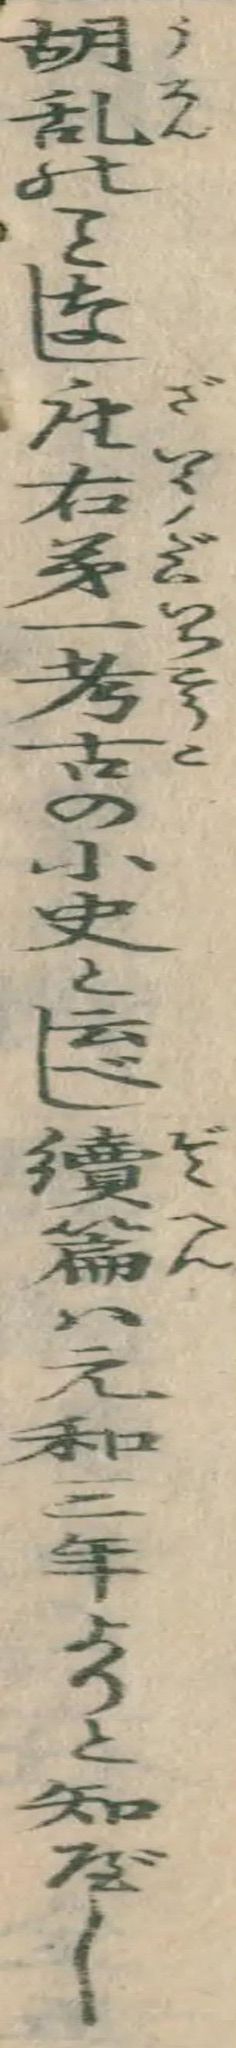胡乱のことなし座右第一考古の小史と云べし続篇は元和三年よりと知べし

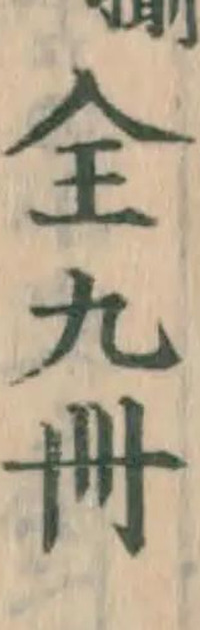全二冊
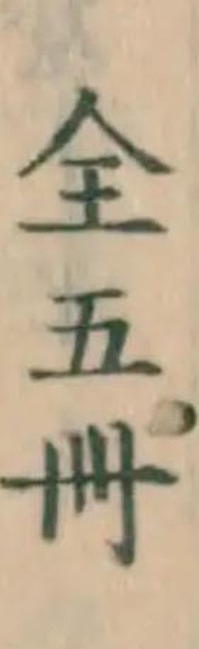全二冊
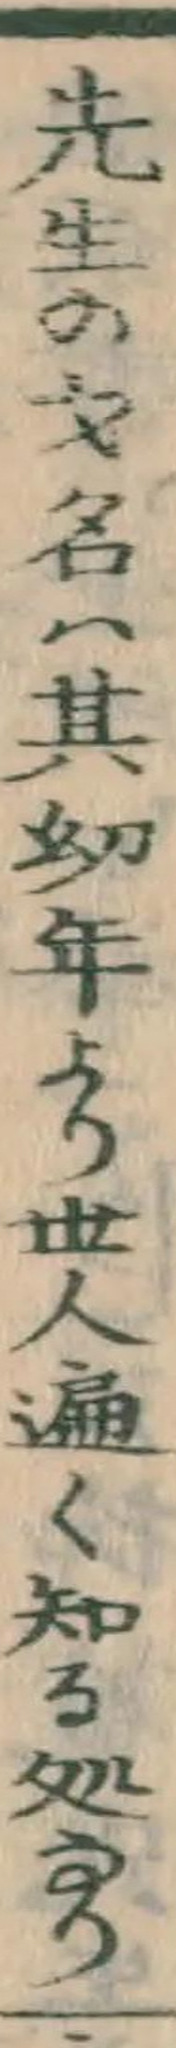先生の才名は其幼年より世人遍く知る処なり
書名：これこれ草 2巻. [2]
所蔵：国立国会図書館 National Diet Library, JAPAN
